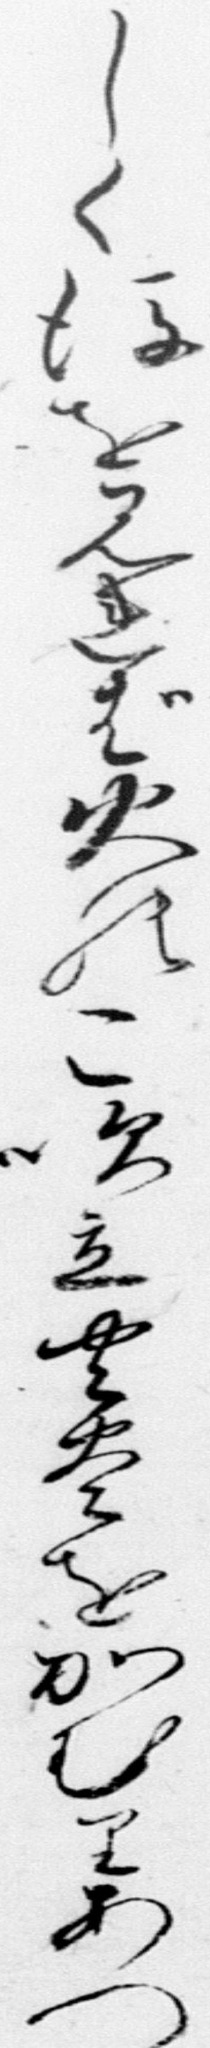しく後を見れば火のこ吹立火炎をかむりあつ
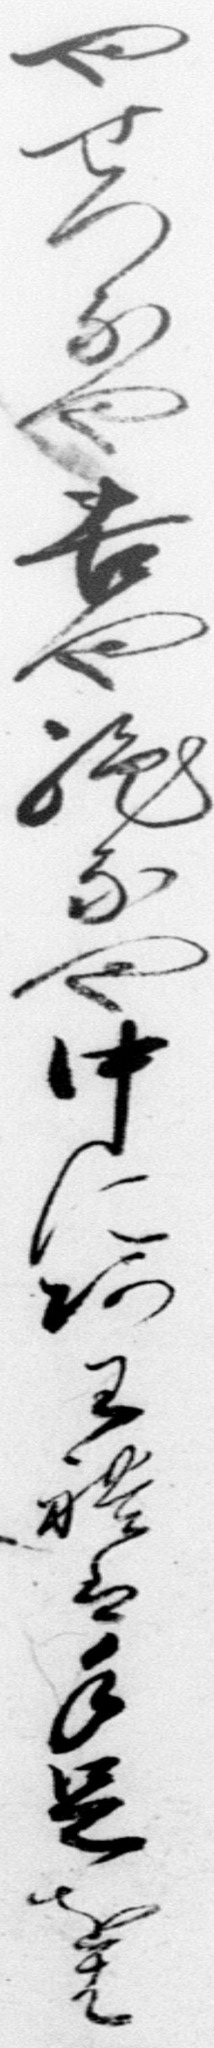やせつなや苦や絶なや中にあわれは手足をは
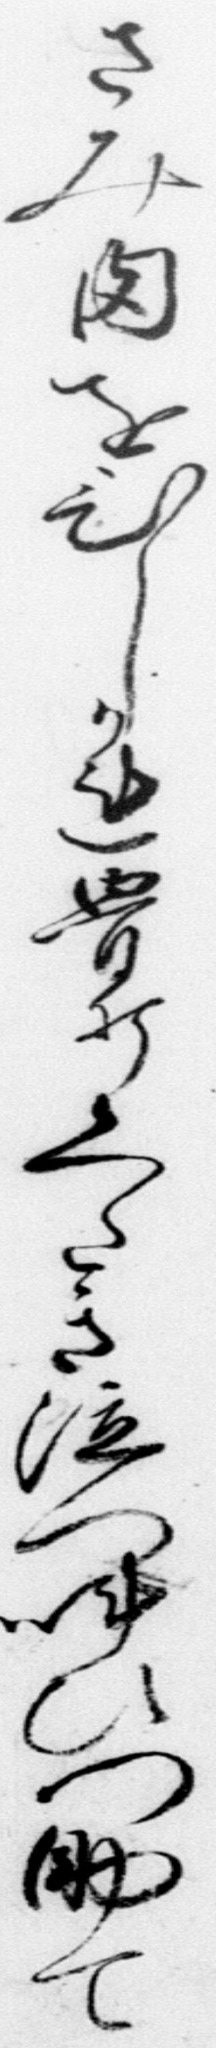さみ肉をひしかれ骨打くたき泣つ呼ひつ助て
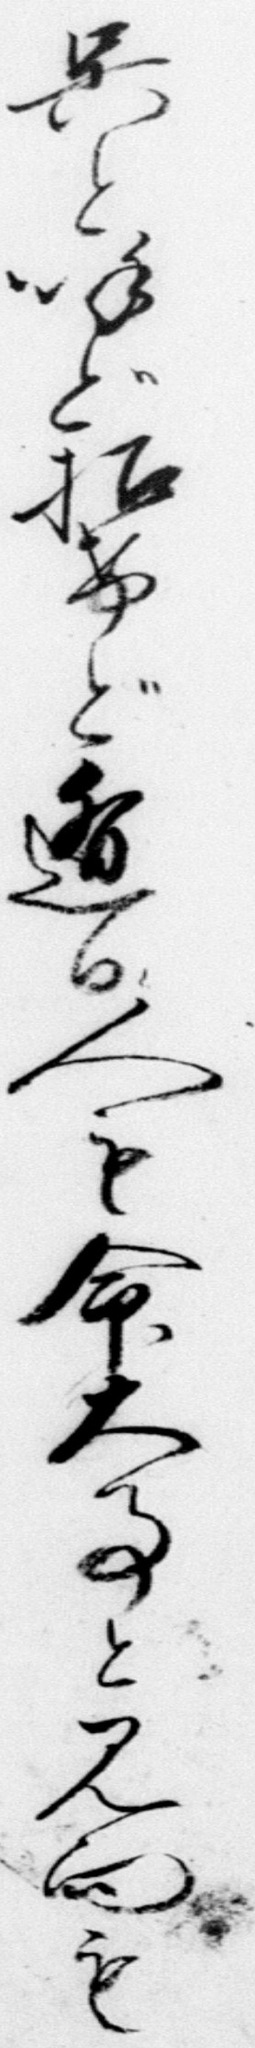呉と呼ど招けど遁る人も命大事と見向も
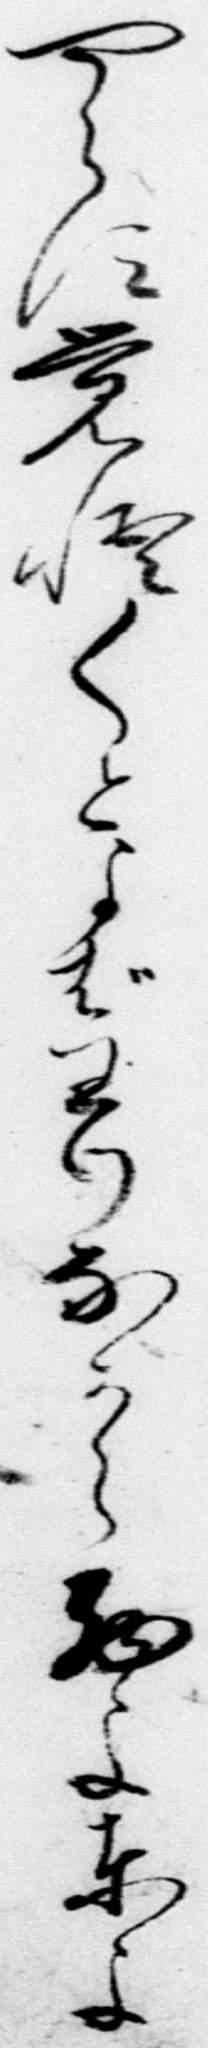やらす覚悟〳〵とよばわりなから西に東に
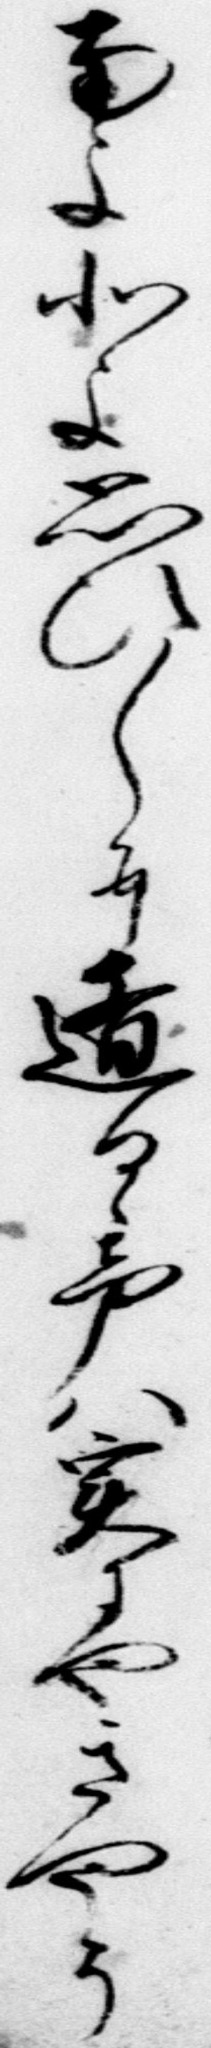南に北に思ひ〳〵に遁るゝ声は実にやきやう

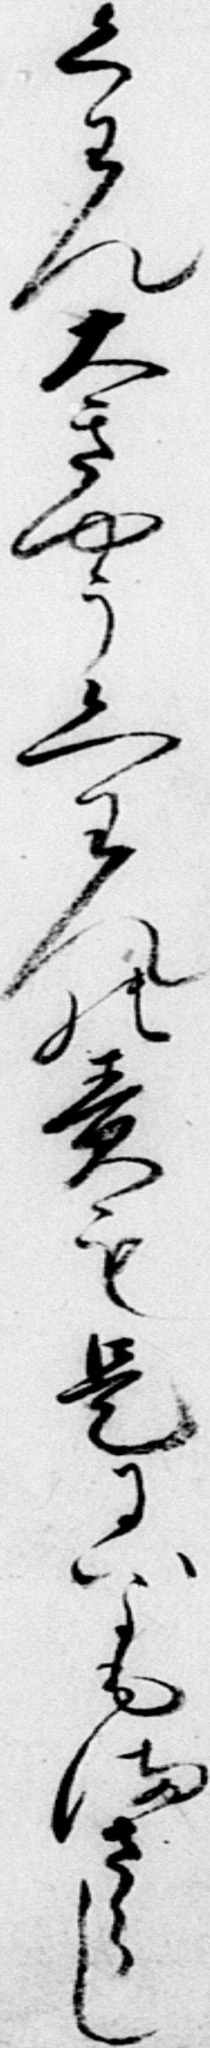くわん大きやうくわんの責も是にはよもまさらし
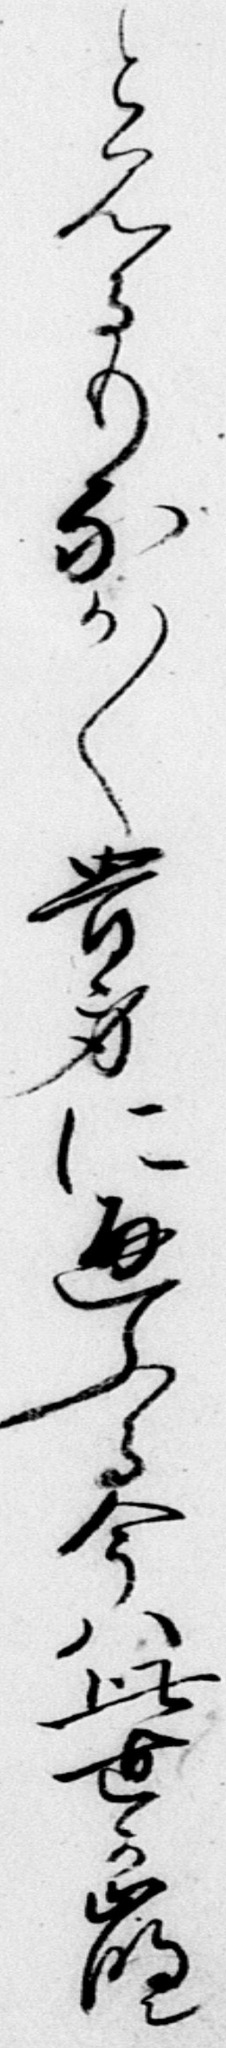と見るもなか〳〵骨身に通ふる今は此世か崩れ
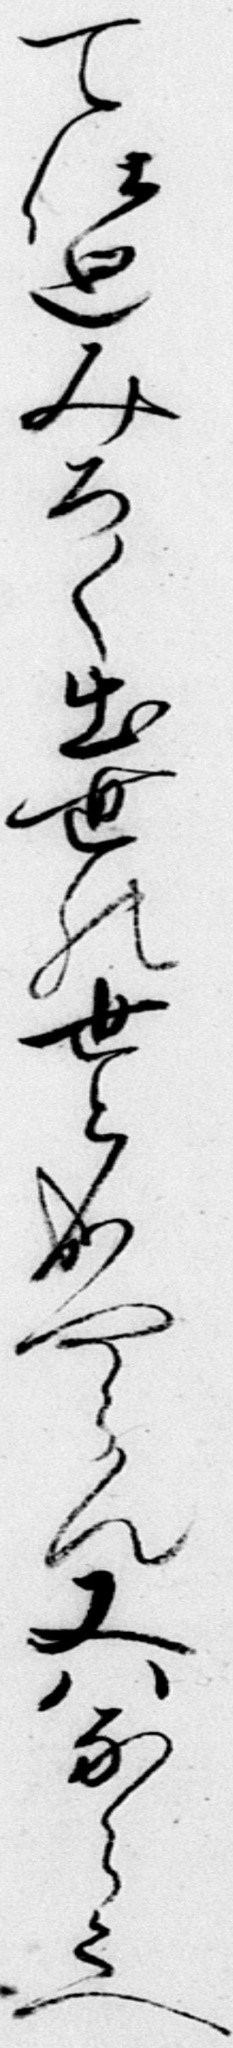て仕廻みろく出世の世と成やらん又はならくへ
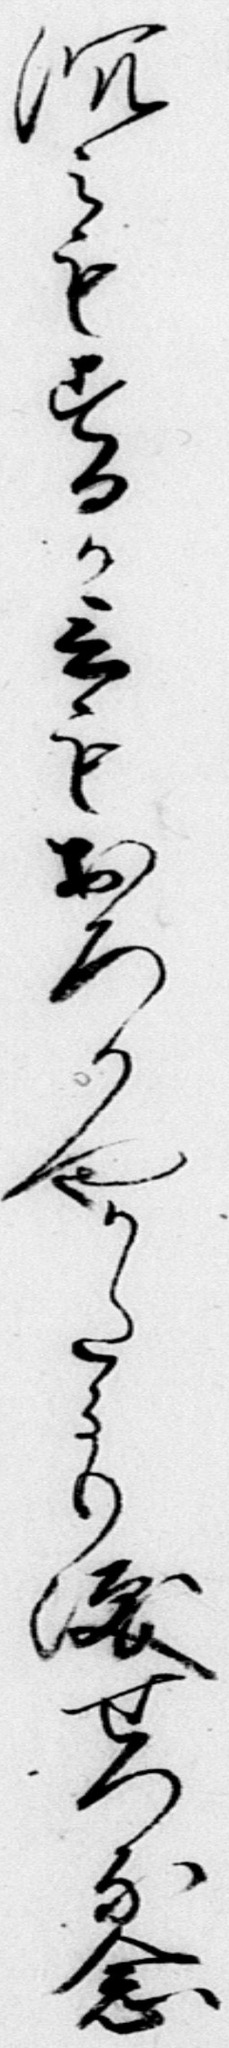沉みもするか言もおろかやかたるも涙せつな念
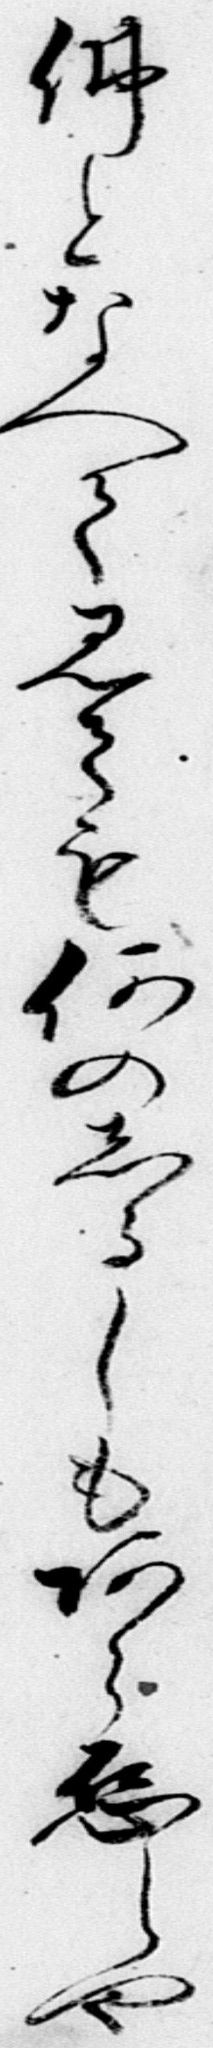仏となへて見ても何のしるしもあらじ恐しや
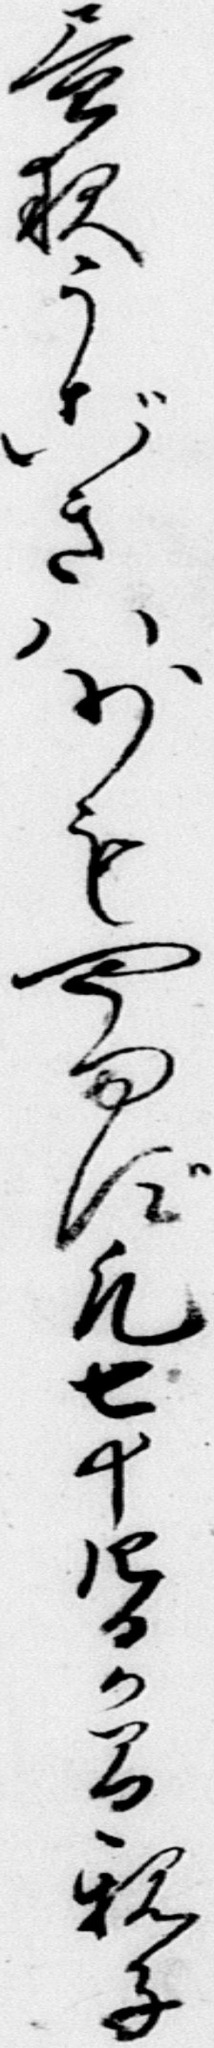昼夜うごきは少もやまず凡七十四日か間親子
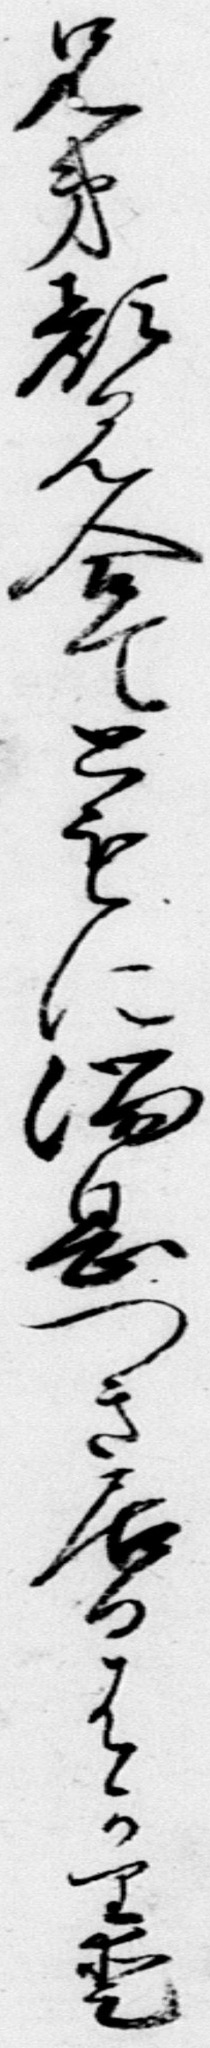兄弟顔見合てともに溜息つき居るはかり愛
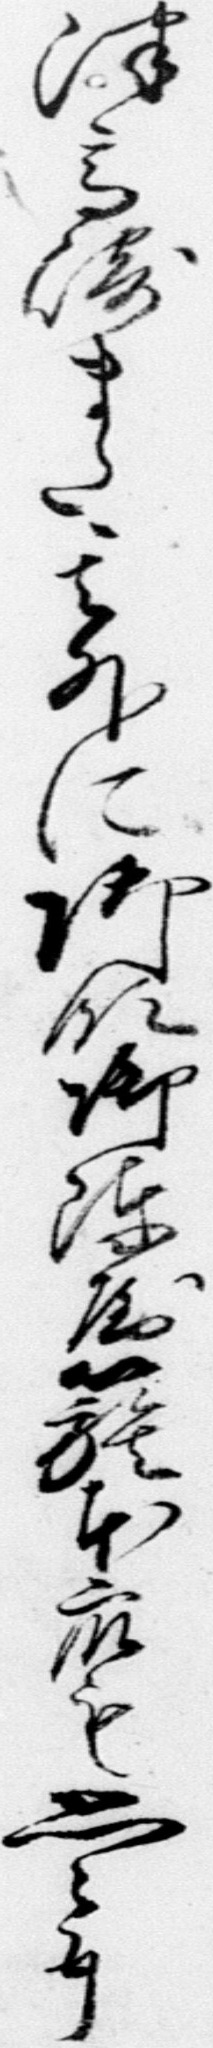津高崎また其外に御領御陣屋籠本衆も思々に
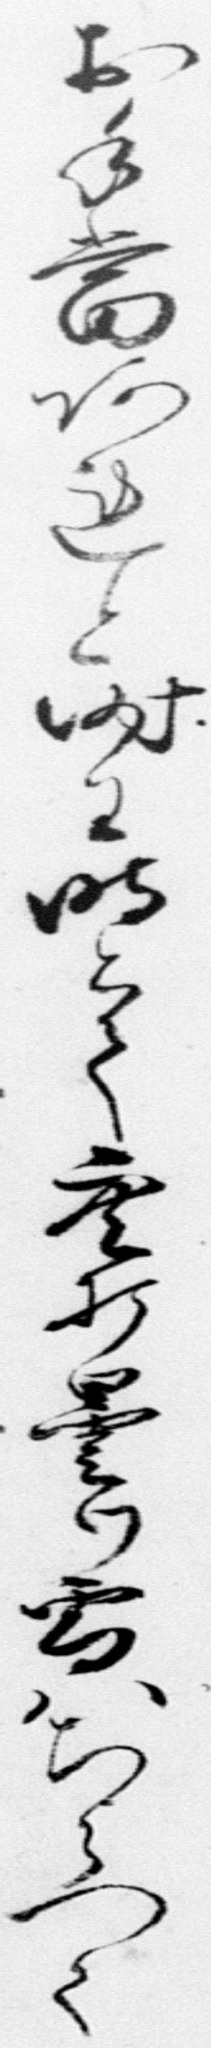お手当あれと時わ時とて空打曇り雪はちらつく
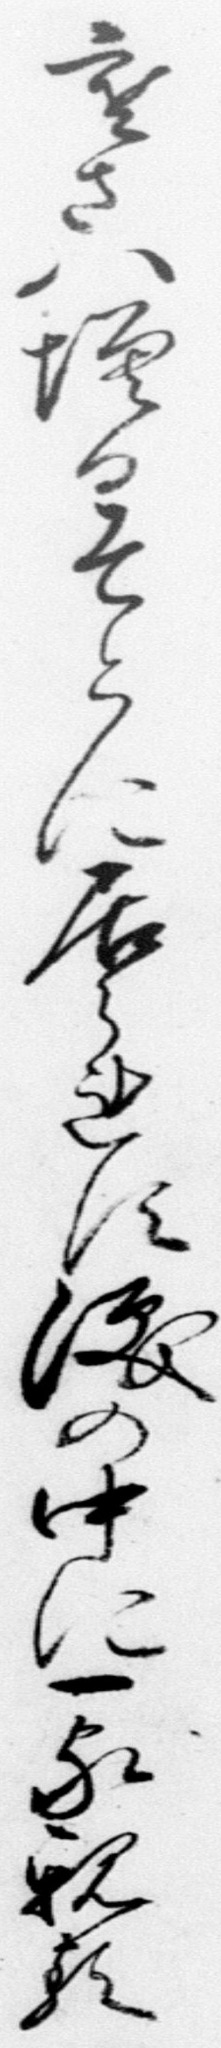寒さは増るそとに居られす涙の中に一家親類
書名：越後地震由来
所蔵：徳島県立図書館
